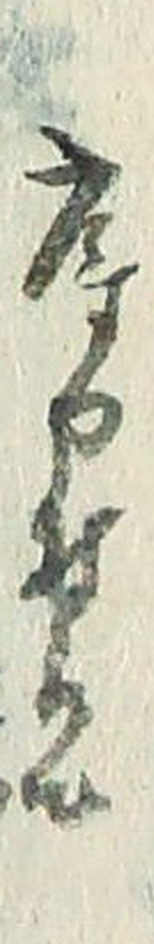府中村庄屋
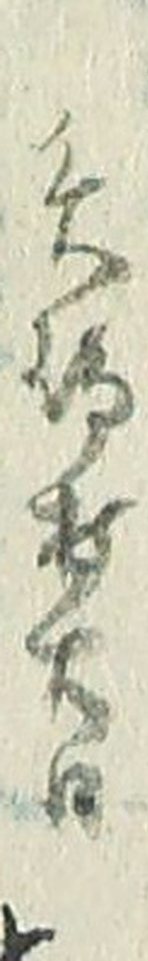矢野村右同
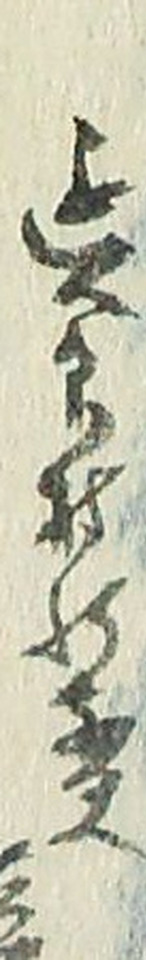延命村肝煎
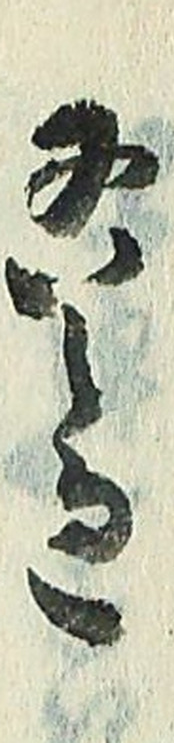右之通
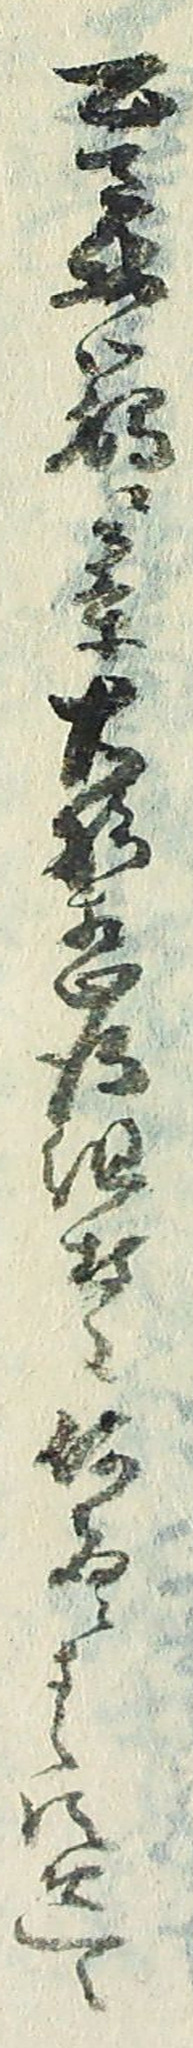公義御触に候条右様相心得組村々何者によらす逸々
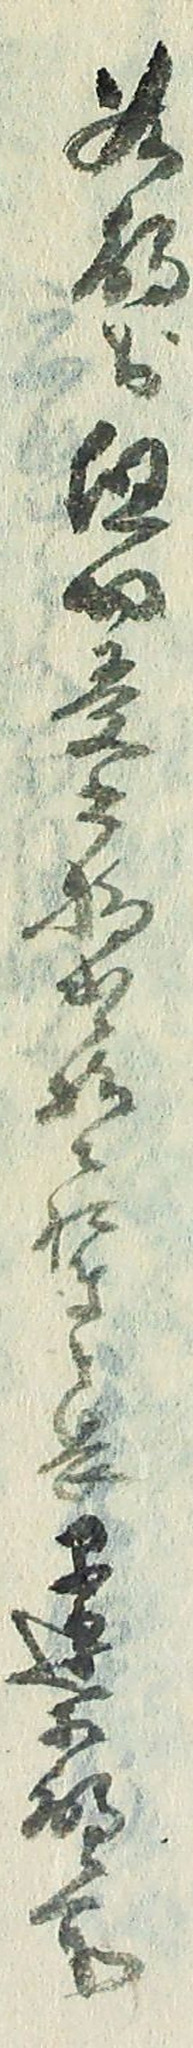為触知組切受書指出候様被仰付奉畏早速相触候所
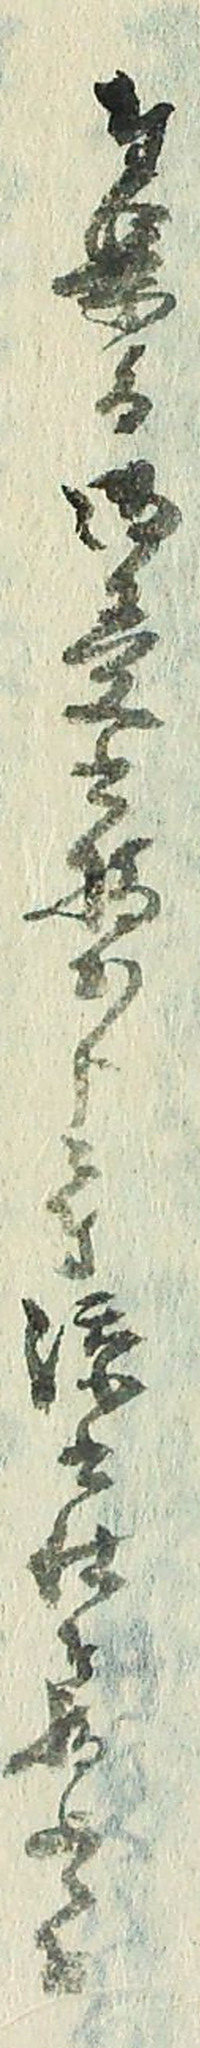奉畏旨御受書指出申に付添書仕奉指上候以上
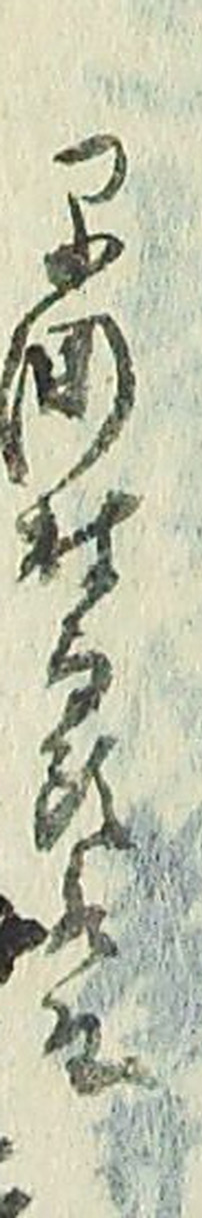早淵村与頭庄屋
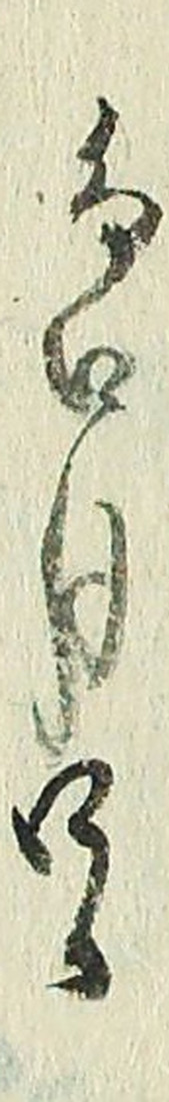卯四月四日
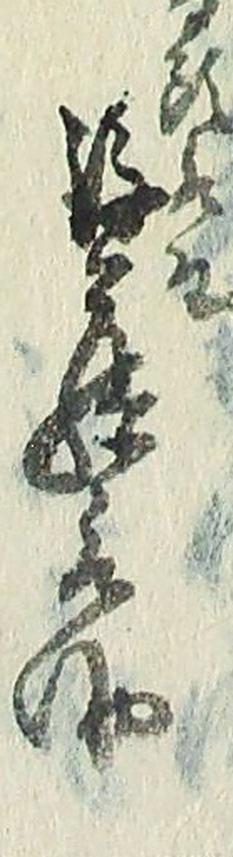後藤庄助
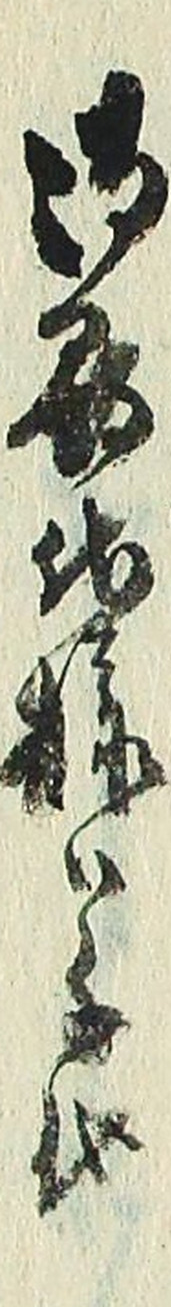御郡代様御手代
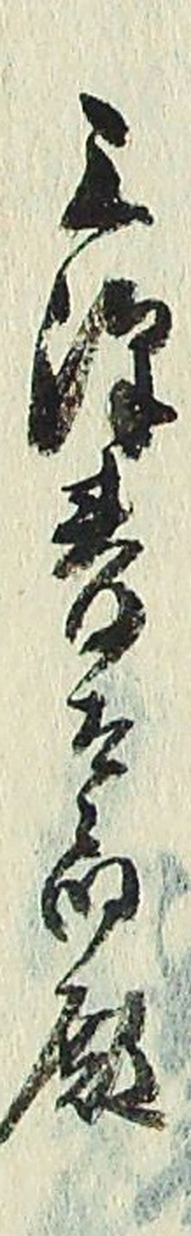三沢春太郎殿
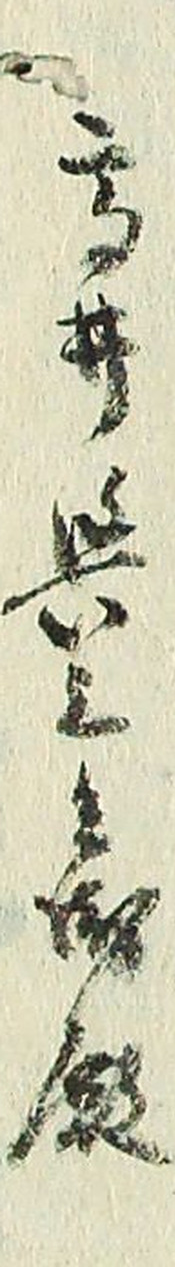高井与三兵衛殿
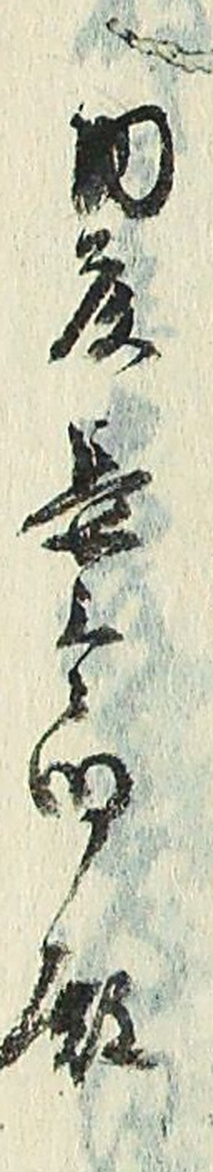内藤長三郎殿

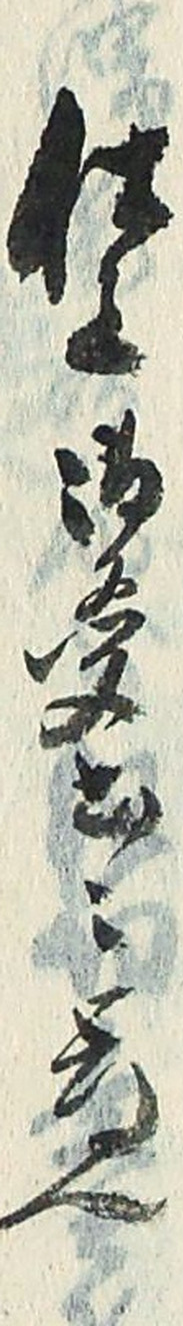仕上御受書之覚
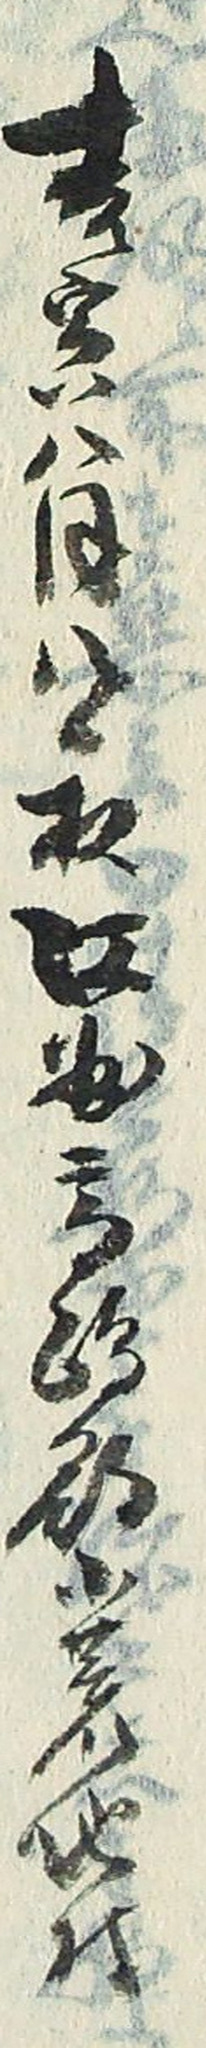去る寅八月八日夜江州高嶋郡小荒地村
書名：諸御用御□受書控
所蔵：鳴門教育大学 Naruto University of Education
